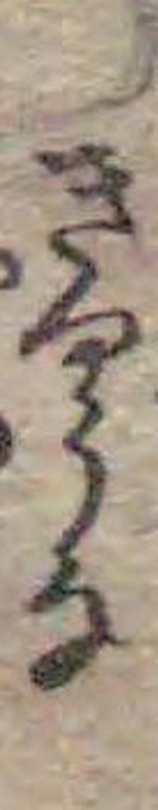きやうな
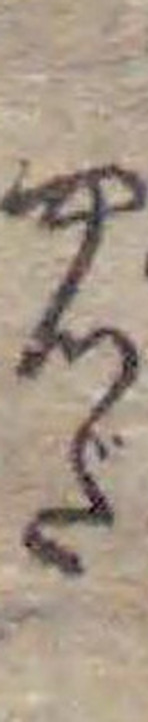やつだ
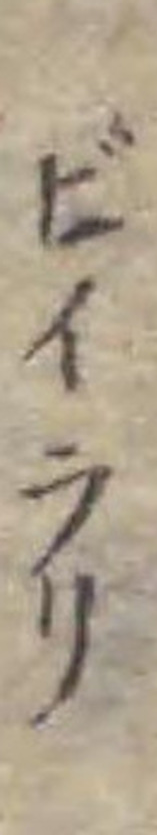ピイラリ
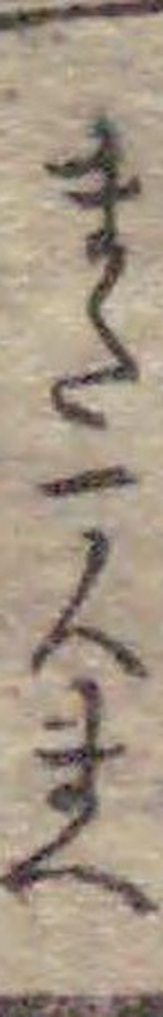また一人まへ
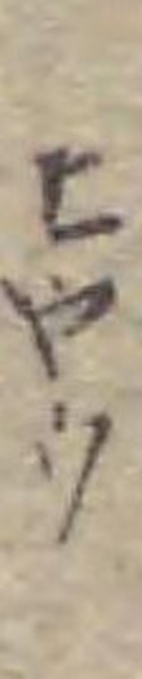ヒヤウ
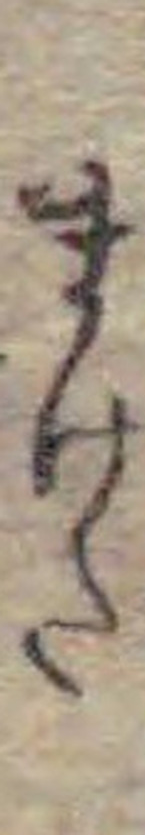まけた
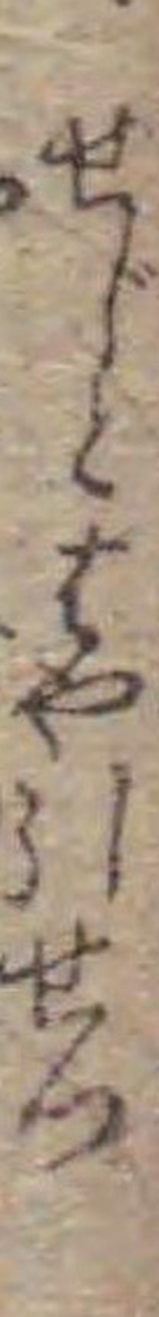せじとはや引せつ
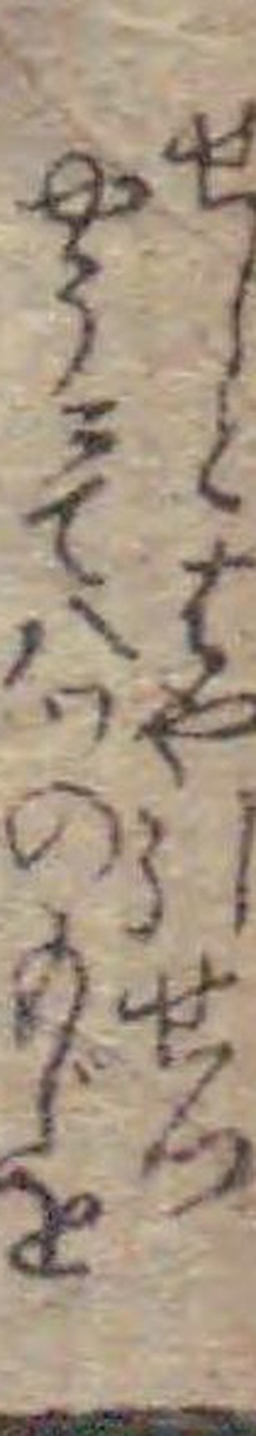やうにて八つのもじを
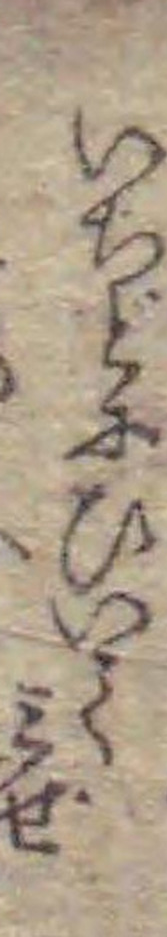いちどにひいて
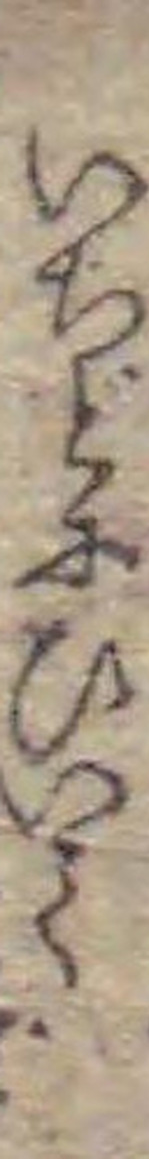いちどにひいて
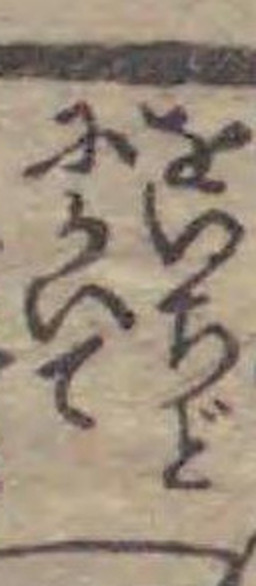にかいて
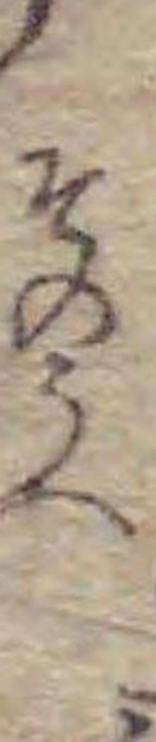そのうへ
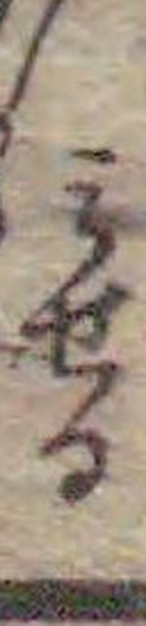みせる
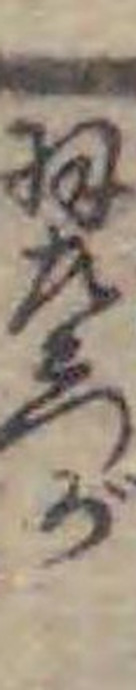羽左衛門が
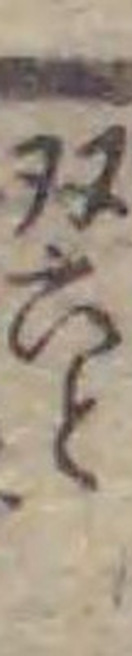双六と
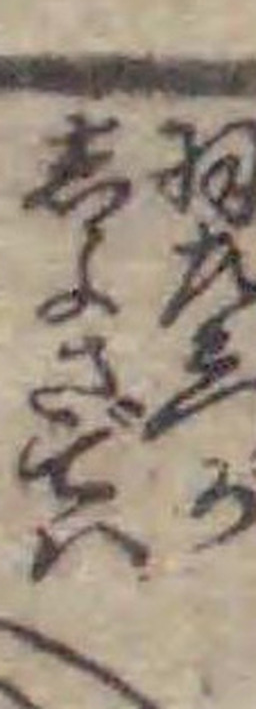しよさでは
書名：時代世話二挺皷 : 2巻
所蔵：国立国会図書館 National Diet Library, JAPAN
